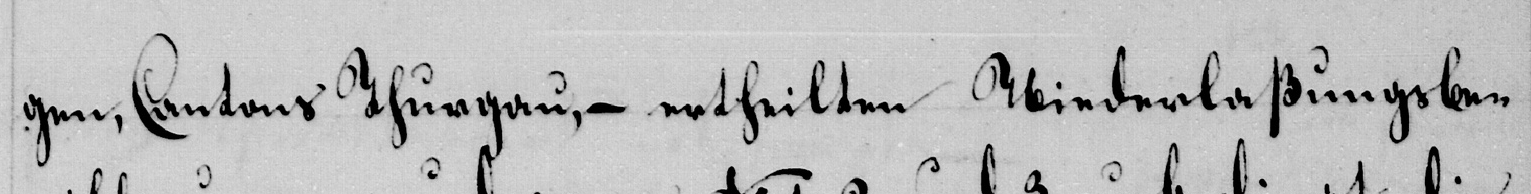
gen, Cantons Thurgau, – ertheilten Niederlaßungsbe¬
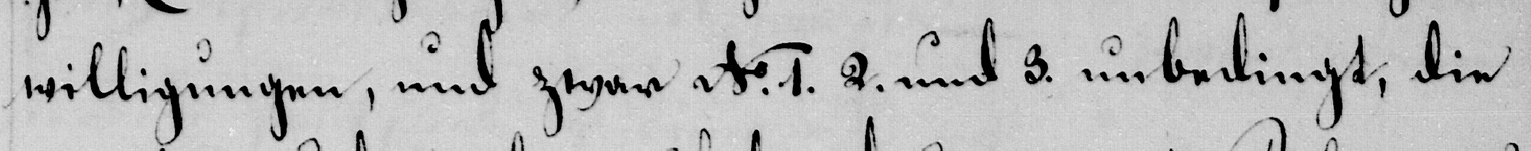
willigungen, und zwar No. 1. 2. und 3. unbedingt, die
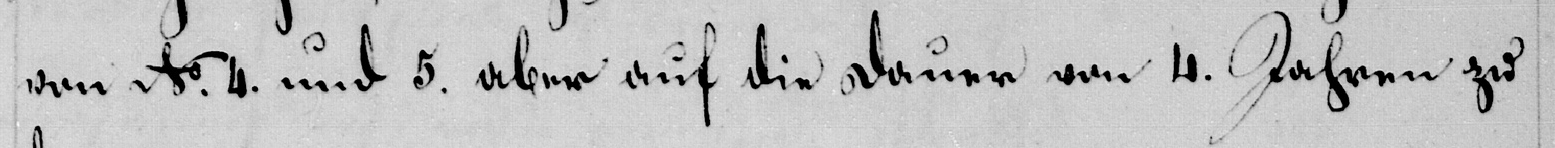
von No. 4. und 5. aber auf die Dauer von 4. Jahren zu
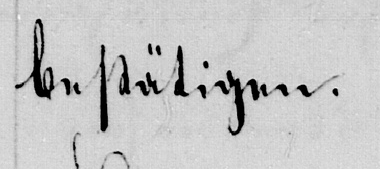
bestätigen.
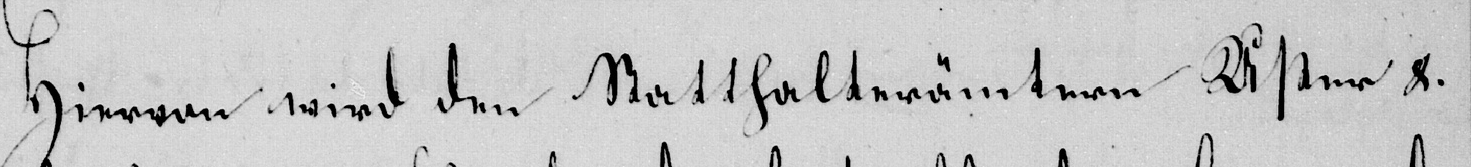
Hiervon wird den Statthalterämtern Uster &.
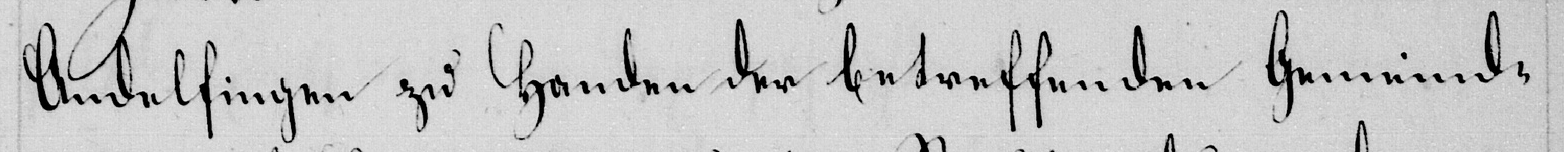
Andelfingen zu Handen der betreffenden Gemeind¬
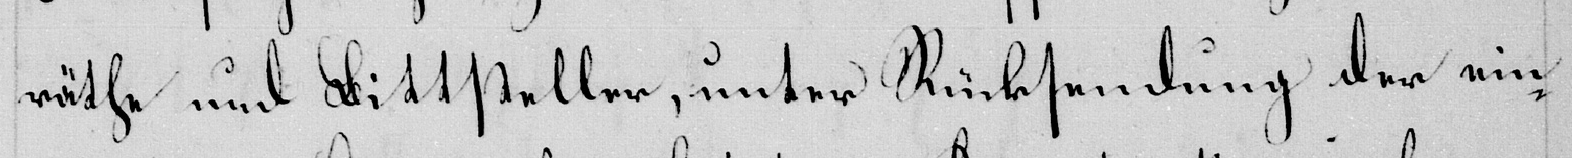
räthe und Bittsteller, unter Rücksendung der ein¬
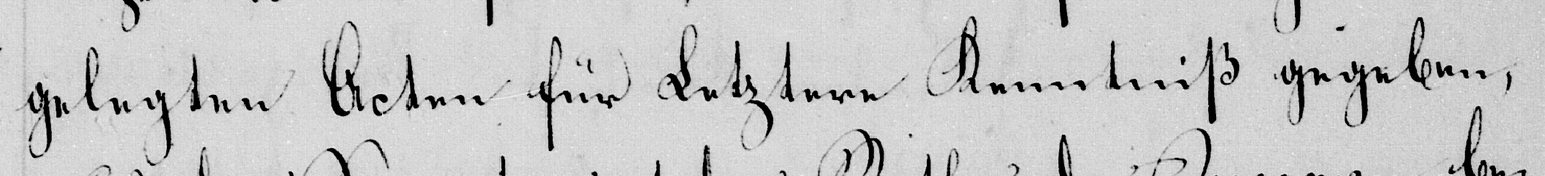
gelegten Acten für Letztere Kenntniß gegeben,
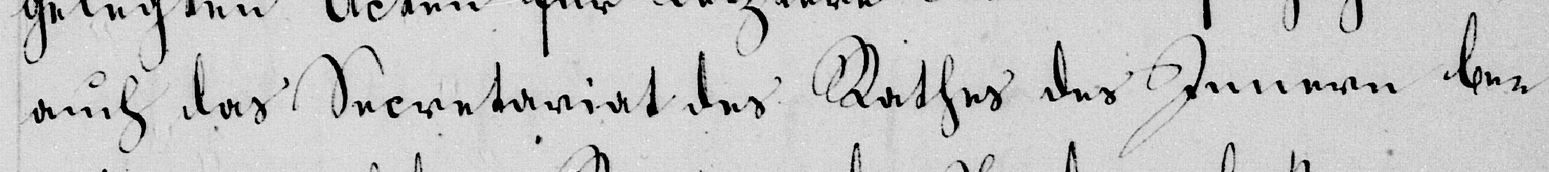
auch das Secretariat des Rathes des Innern be¬
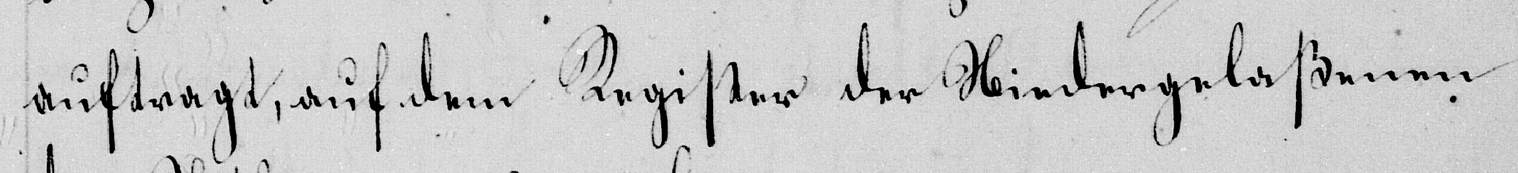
auftragt, auf dem Register der Niedergelaßenen
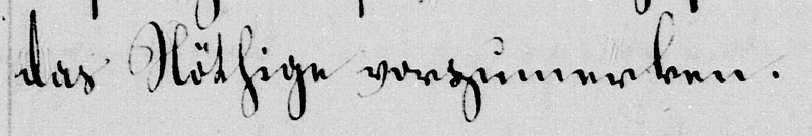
das Nöthige vorzumerken.
